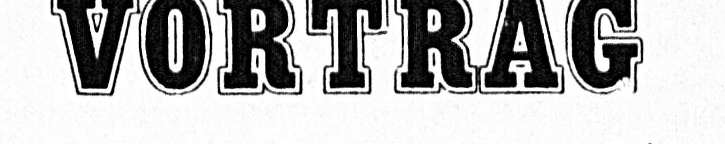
VORTRAG
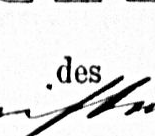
des
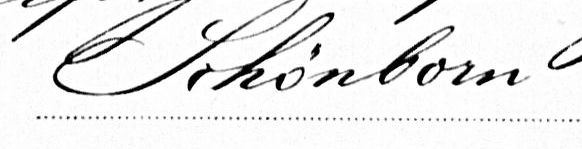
Schönborn
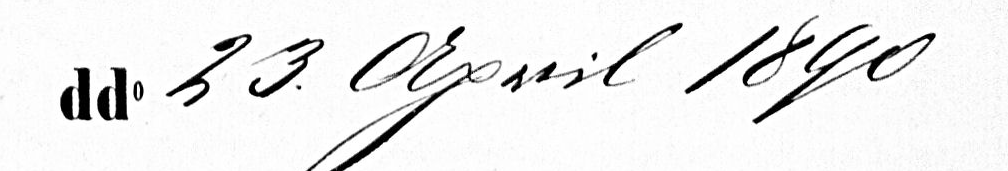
dd° 23. April 1890
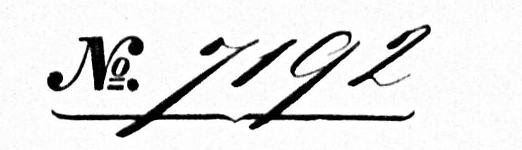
N° 7192
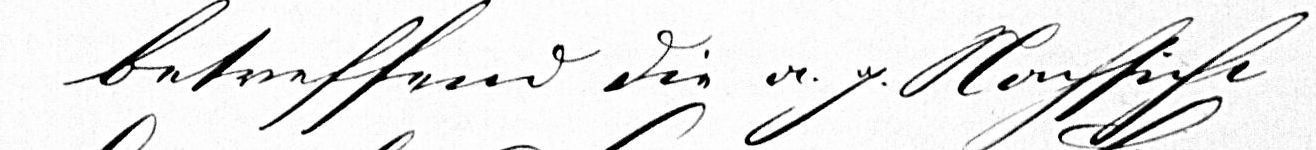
betreffend die a. g. Nachsiche
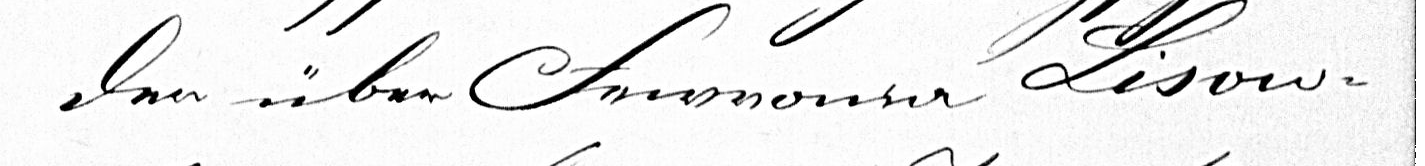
der über Fewvonur Lisow¬
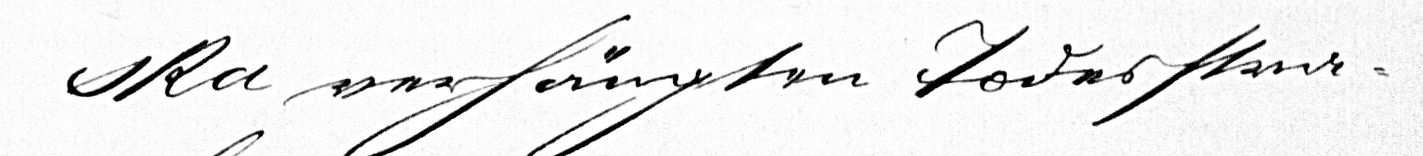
ska verhängten Todesstra¬
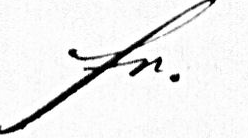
fe.
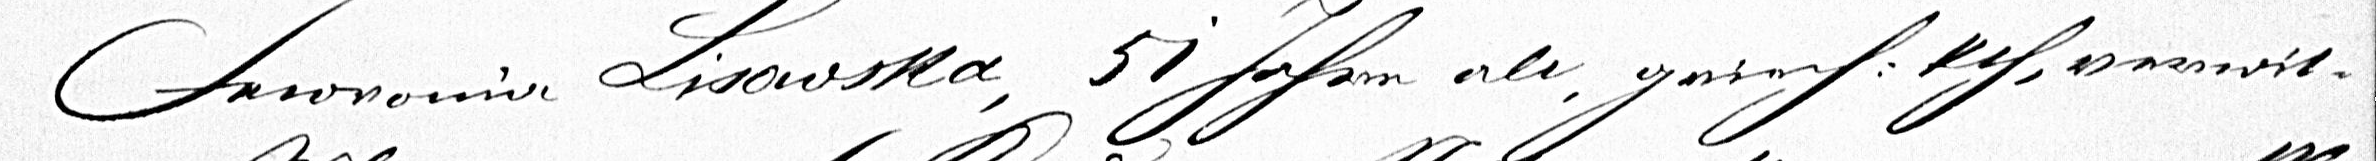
Fewvonur Lisowska, 51 Jahre alt, griech: kth, verwit¬
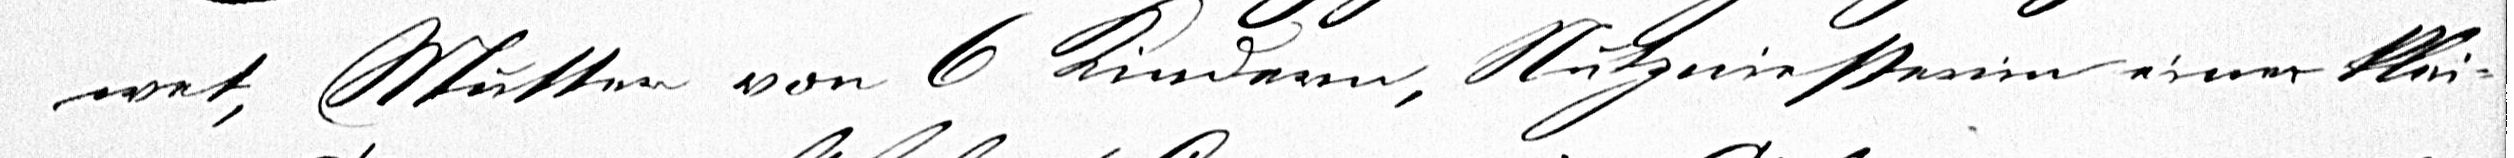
wet, Mutter von 6 Kindern, Nutnißxx einer kei¬
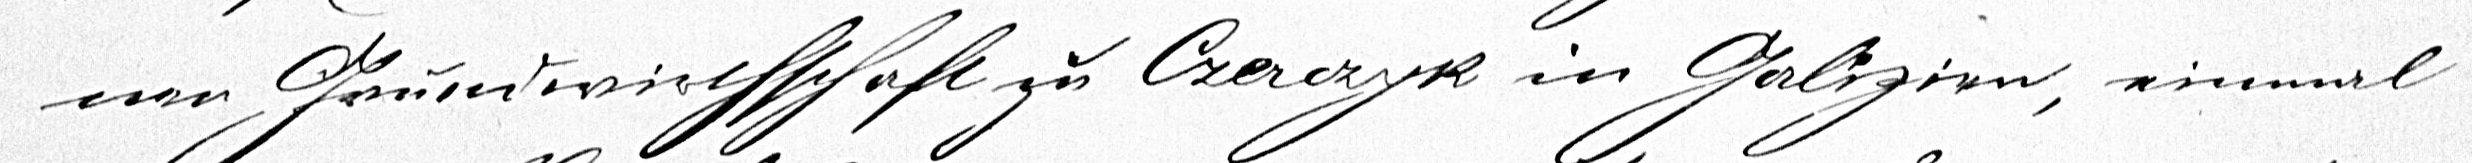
nen Grundwirthschaft zu Czerczyk in Galizien, einmal
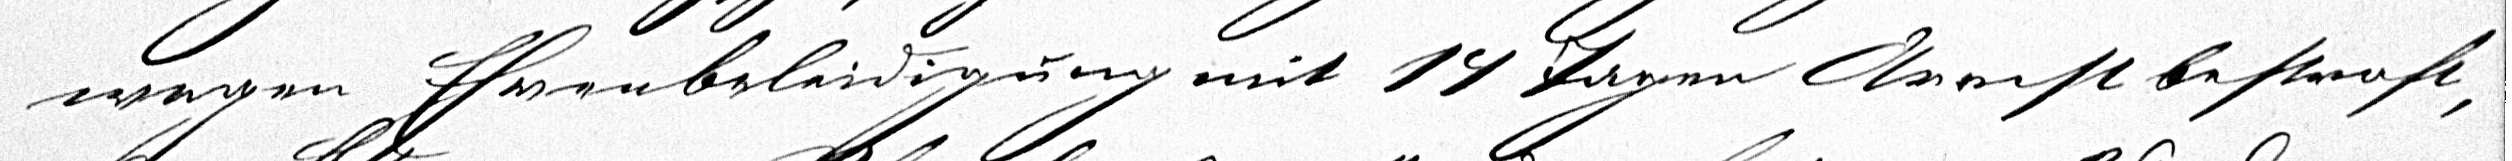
wegen Ehrenbeleidigung mit 14 Tagen Arrest bestraft,
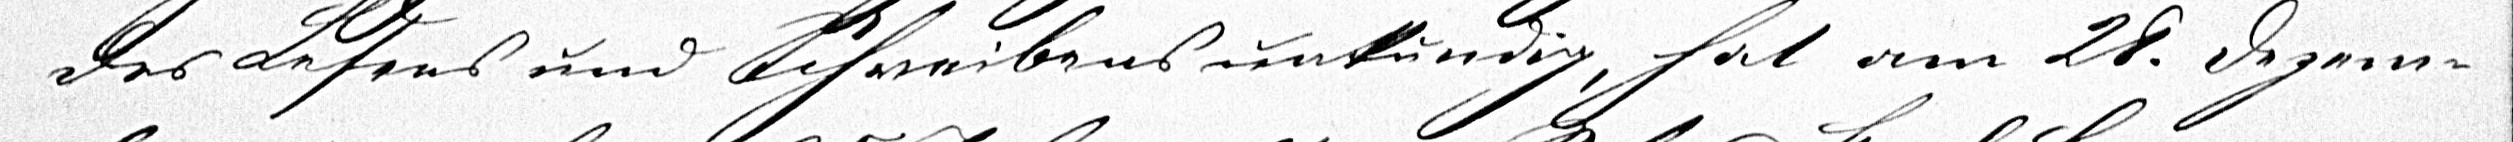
des Lesers und Schreibens unkundig, hat am 28. Dezem¬
